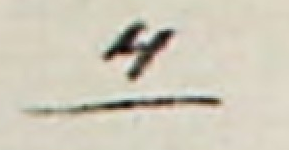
4
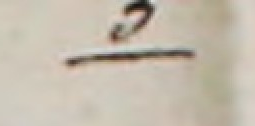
5
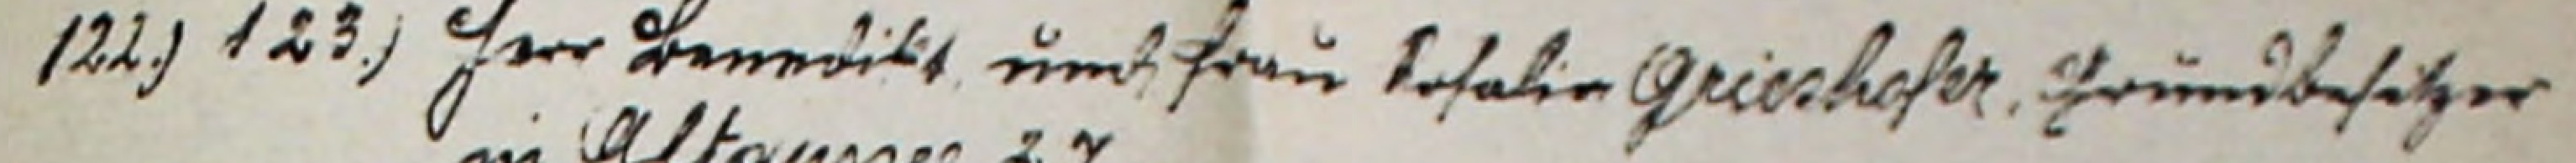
122.) 123.) Herr Benedikt, und Frau Rosalia Grieshofer, Grundbesitzer
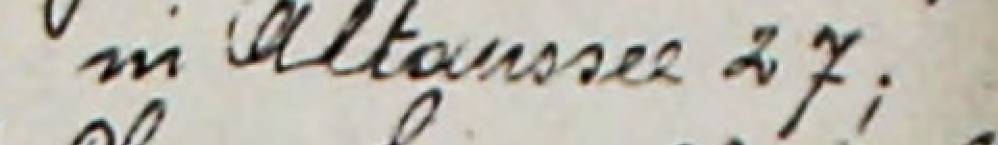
in Altaussee 27;
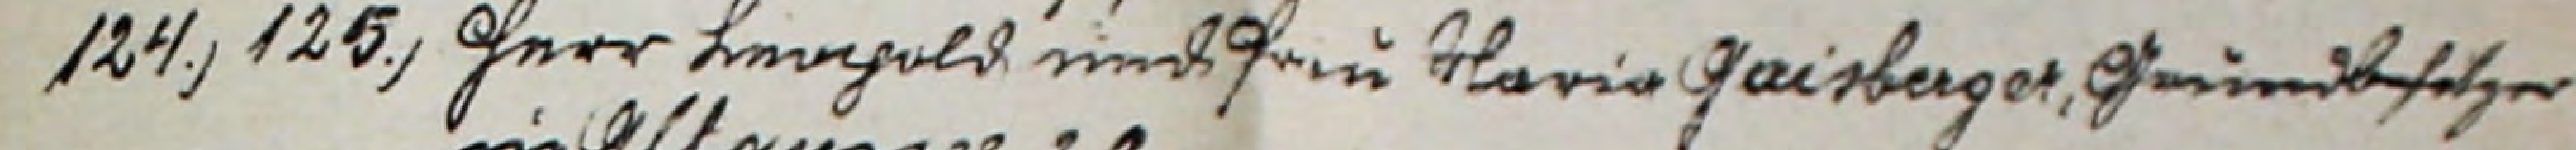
124.) 125.) Herr Leopold und Frau Maria Gaisberger, Grundbesitzer
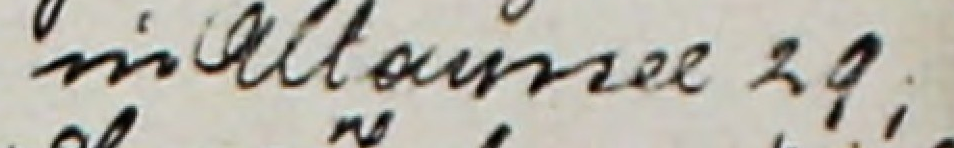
in Altaussee 29;
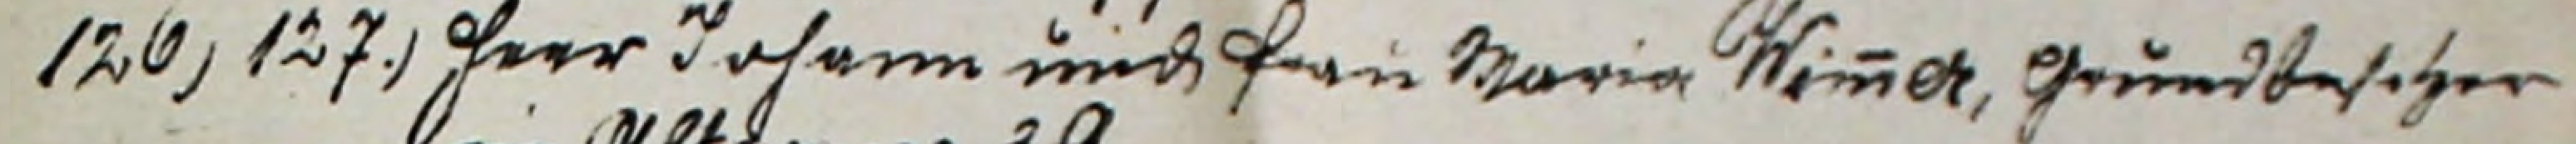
126) 127.) Herr Johann und Frau Maria Wimmer, Grundbesitzer
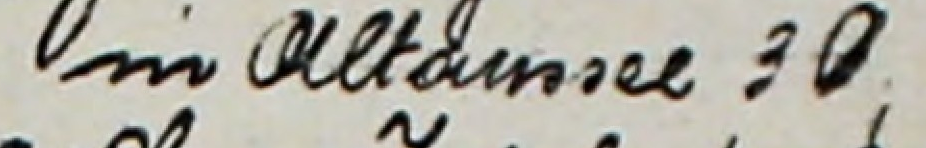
in Altaussee 30;
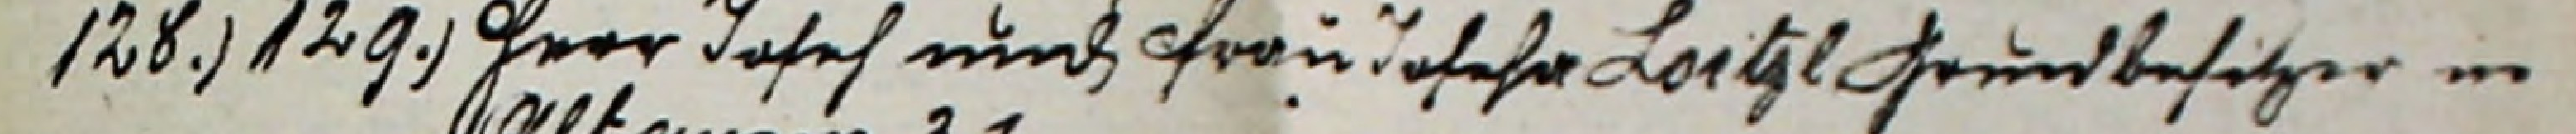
128.) 129.) Herr Josef und Frau Josefa Loitzl Grundbesitzer in
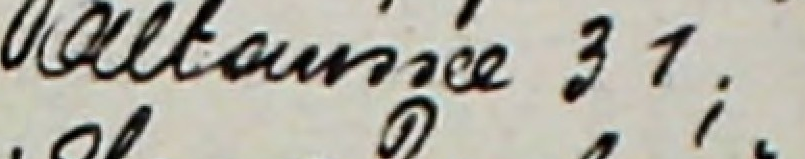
Altaussee 31;
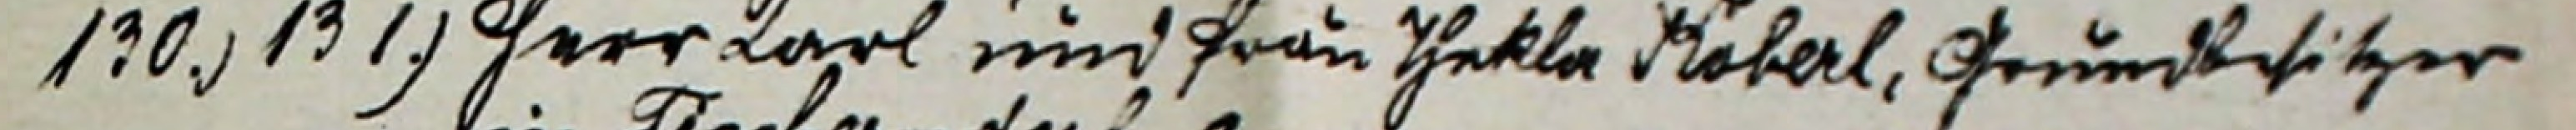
130.) 131.) Herr Karl und Frau Thekla Köberl, Grundbesitzer
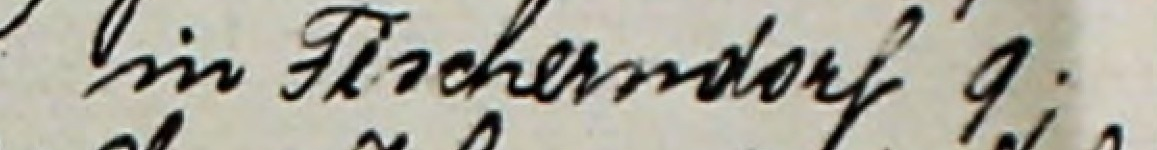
in Fischerndorf 9;
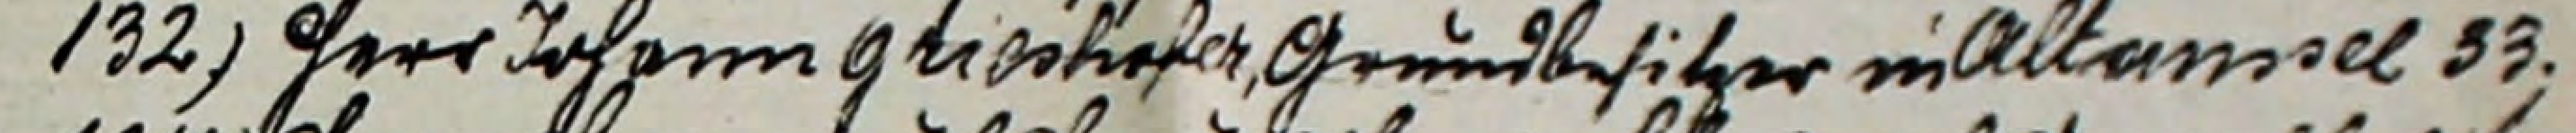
132.) Herr Johann Grieshofer, Grundbesitzer in Altaussee 33;
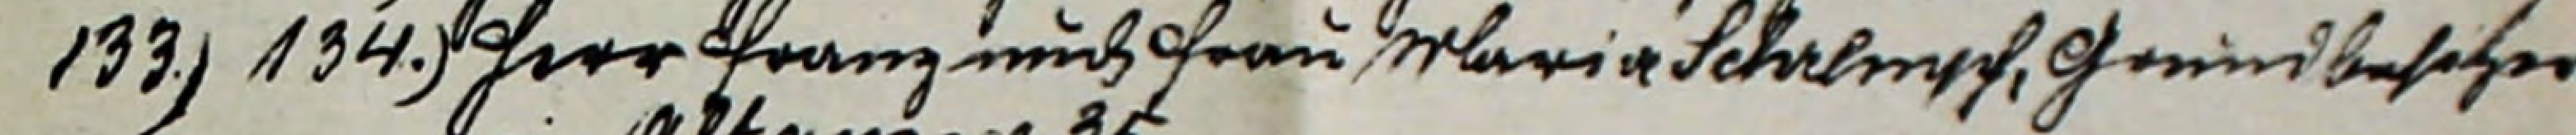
133.) 134.) Herr Franz und Frau Maria Schrempf, Grundbesitzer
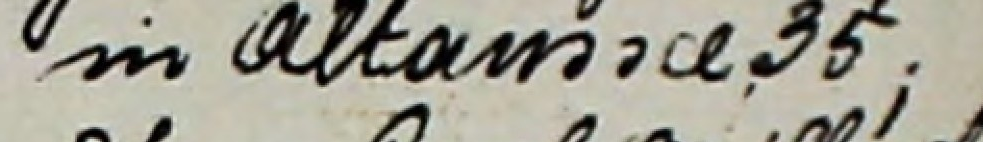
in Altaussee 35;
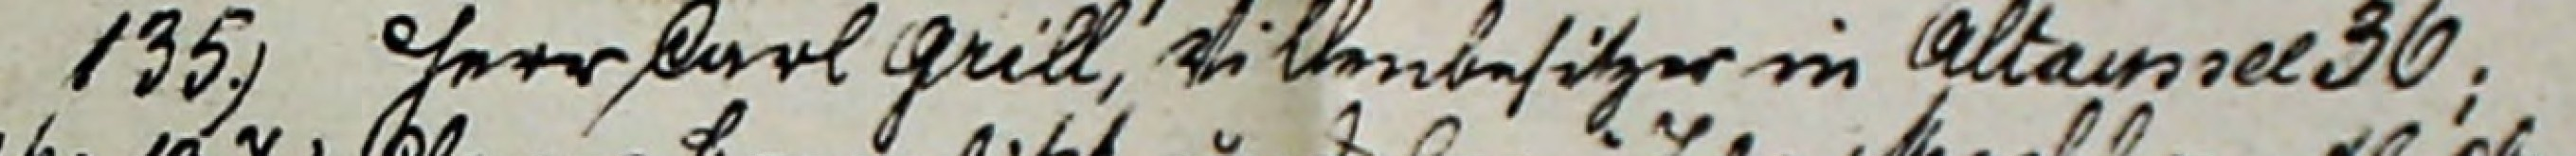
135.) Herr Carl Grill, Villenbesitzer in Altaussee 36;
